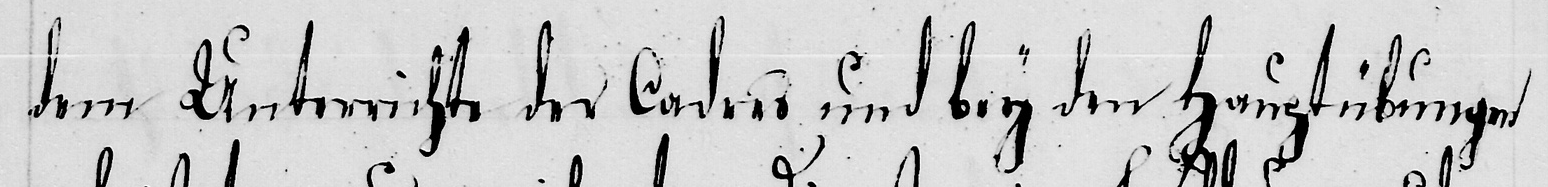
dem Unterrichte der Cadres und bey den Hauptübungen
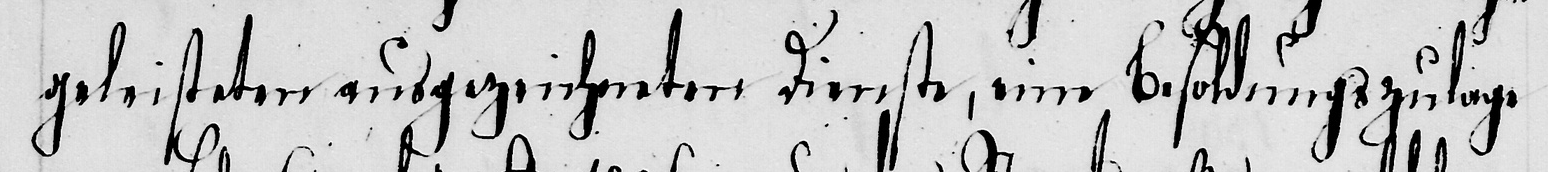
geleisteten ausgezeichneten Dienste, eine Besoldungszulage
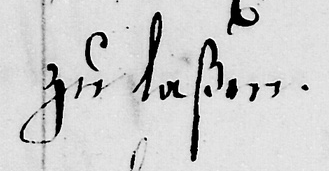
zu laßen.
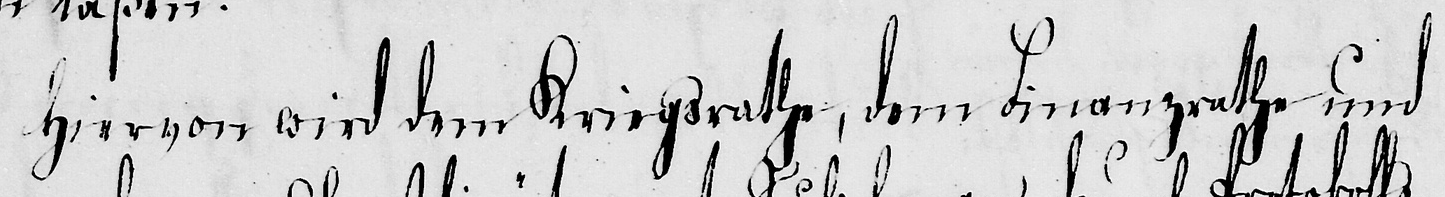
Hiervon wird dem Kriegsrathe, dem Finanzrathe und
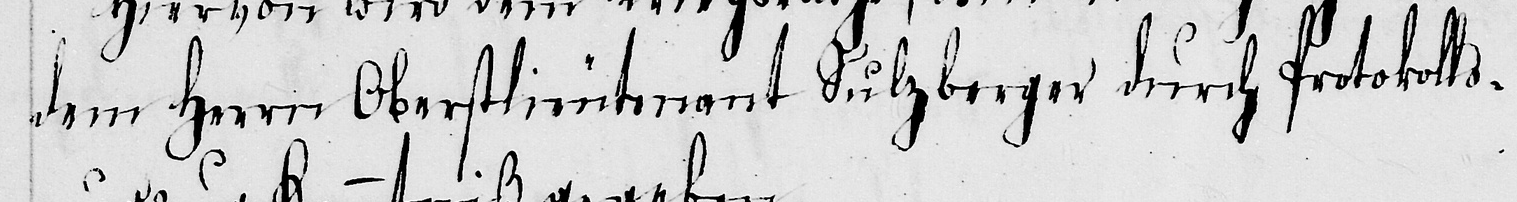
dem Herrn Oberstlieutenant Sulzberger durch Protokolls¬
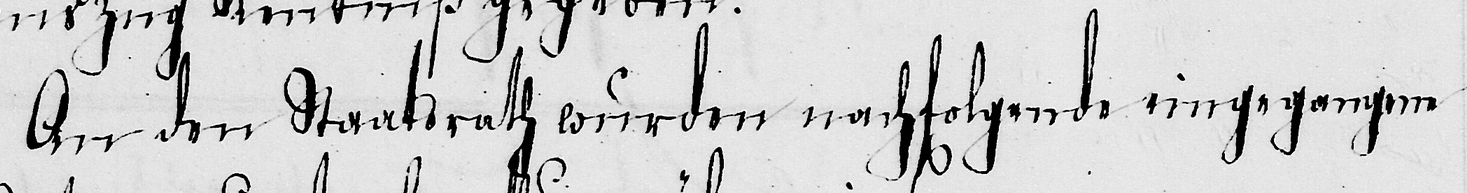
An den Staatsrath wurden nachfolgende eingegangene
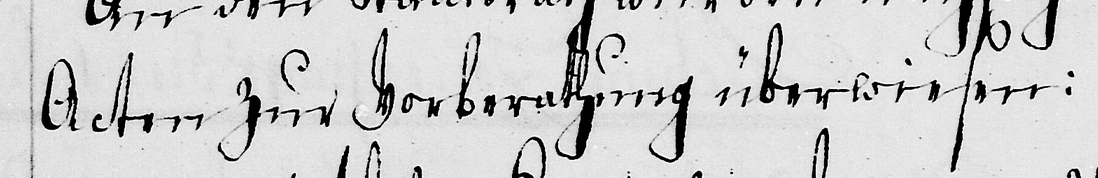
Acten zur Vorberathung überwiesen:
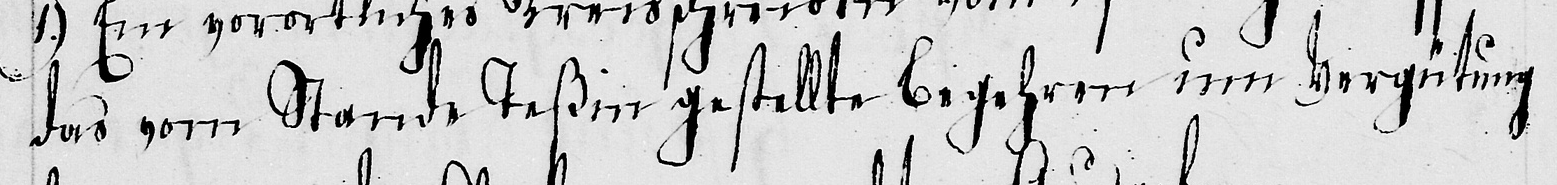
das vom Stande Teßin gestellte Begehren um Vergütung
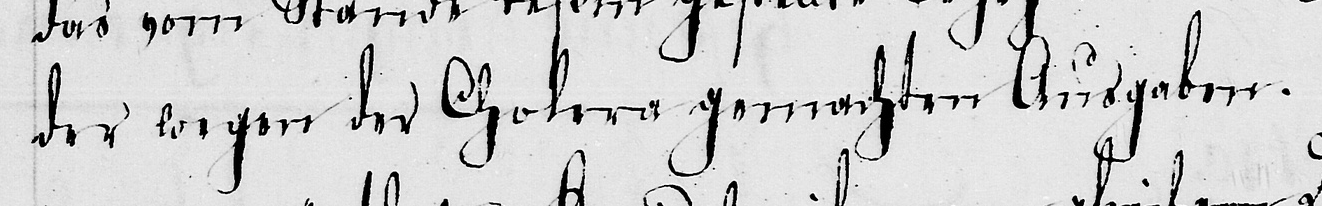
der wegen der Cholera gemachten Ausgaben.
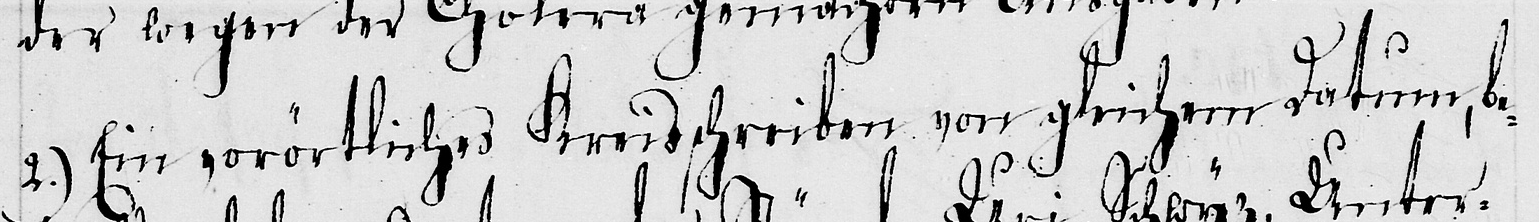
2.) Ein vorörtliches Kreisschreiben von gleichem Datum, be¬
